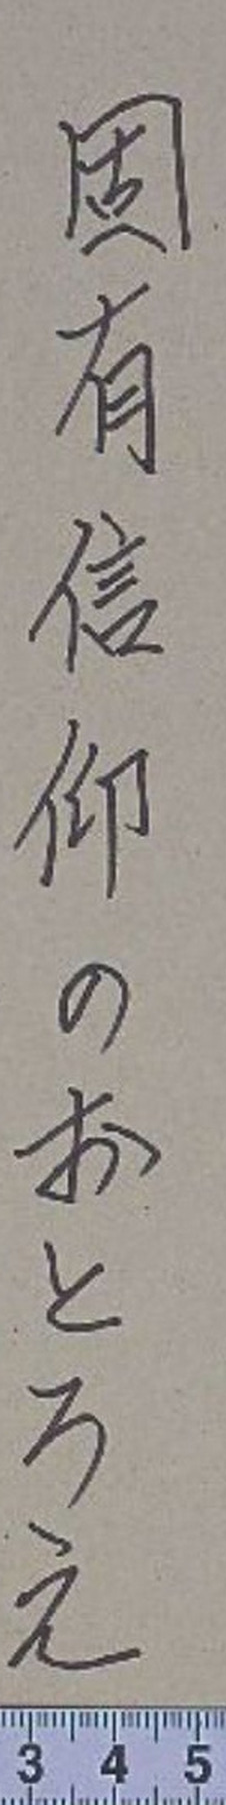固有信仰のおとろえ
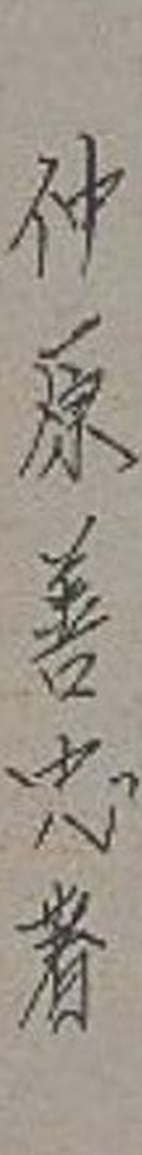仲原善忠著

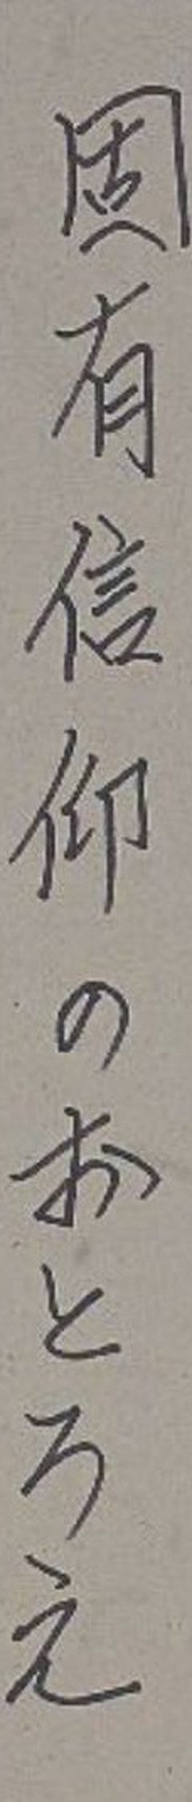固有信仰のおとろえ
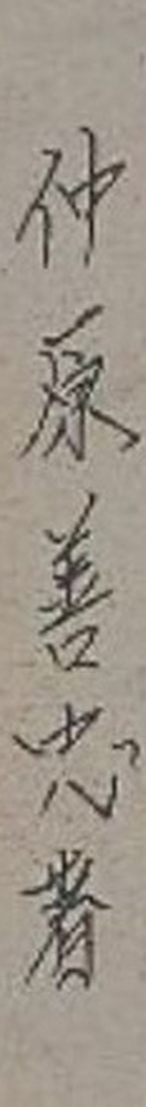仲原善忠著

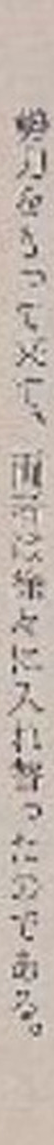勢力をもって来て、両者は徐々に入れ替ったのである。
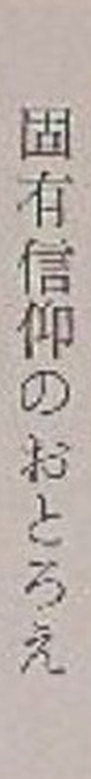固有信仰のおとろえ
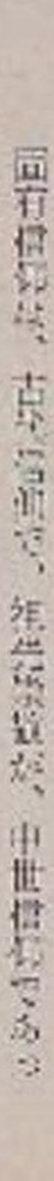固有信仰は、古代信仰で、祖先崇敬が、中世信仰であっ
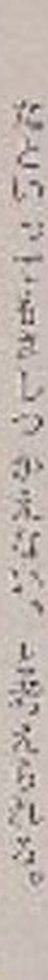たといってもさしつかえない、と考えられる。
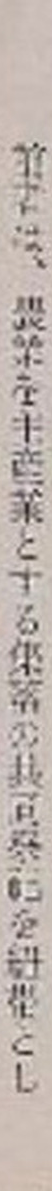前者は、農業を主産業とする集落の共同祭祀を紐帯とし
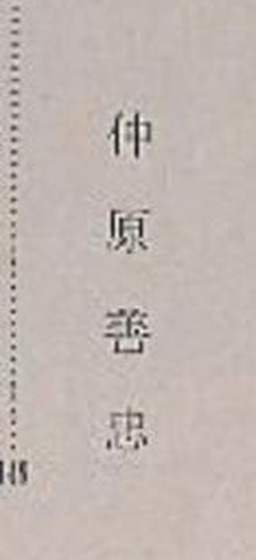仲原善忠
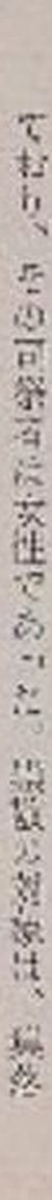ており、その司祭者は女性であった。崇敬の対象は、集落
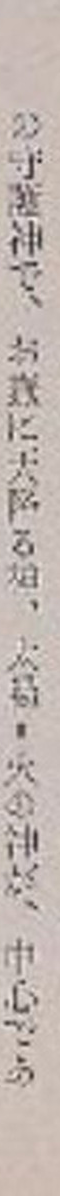の守護神で、お嶽に天降る神、太陽＝火の神が、中心であ
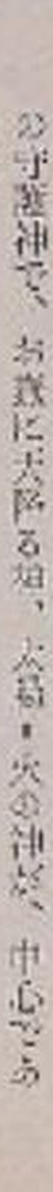の守護神で、お嶽に天降る神、太陽＝火の神が、中心であ
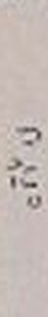った。
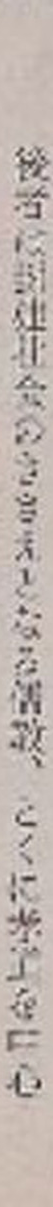後者は封建社会のささえとなる儒教、とくに孝を中心
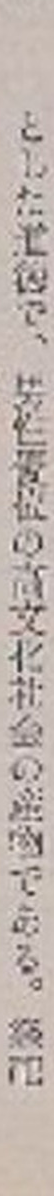としたで、男性優位の高文化社会の産物である。祭祀
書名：沖縄固有信仰のおとろえ
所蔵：University of the Ryukyus Library
